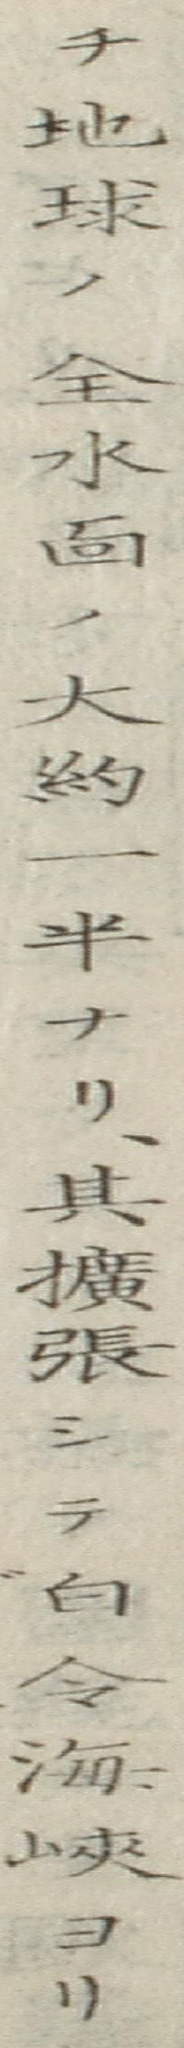チ地球ノ全水面ノ大約一半ナリ、其拡張シテ白令海峡ヨリ
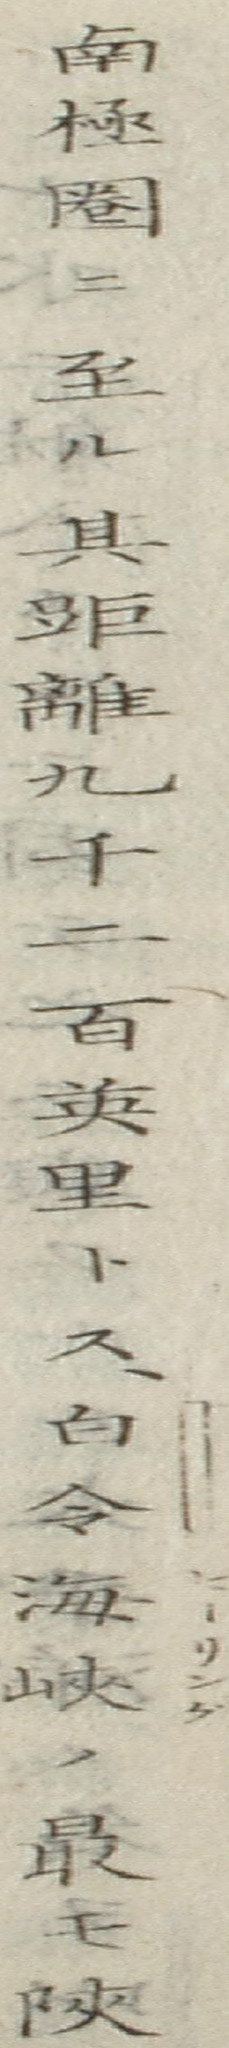南極圏ニ至ル其距離九千二百英里トス、白令海峡ノ最モ狭
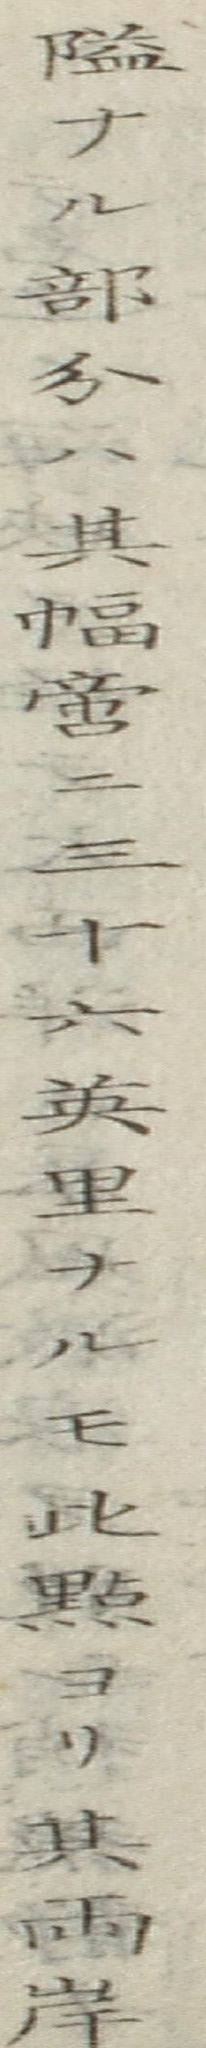隘ナル部分ハ其幅啻ニ三十六英里ナルモ此点ヨリ其両岸
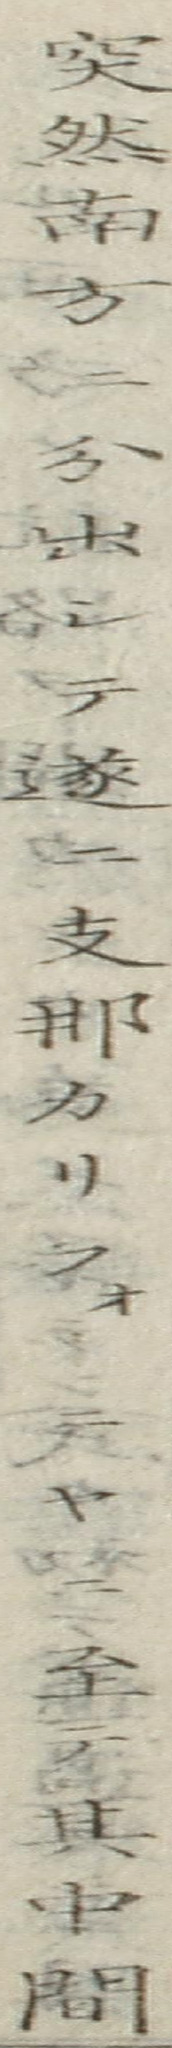突然南方ニ分出シテ遂ニ支那カリフォーニヤニ至テ其中間
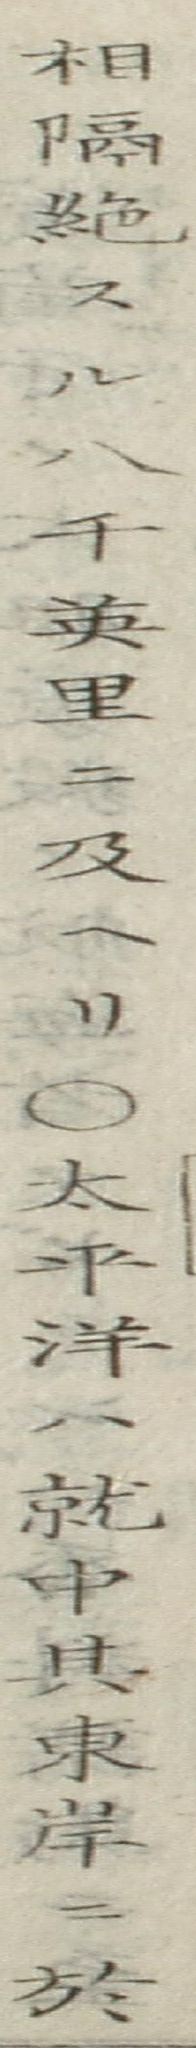相隔絶スル八千英里ニ及ヘリ○太平洋ハ就中其東岸ニ於
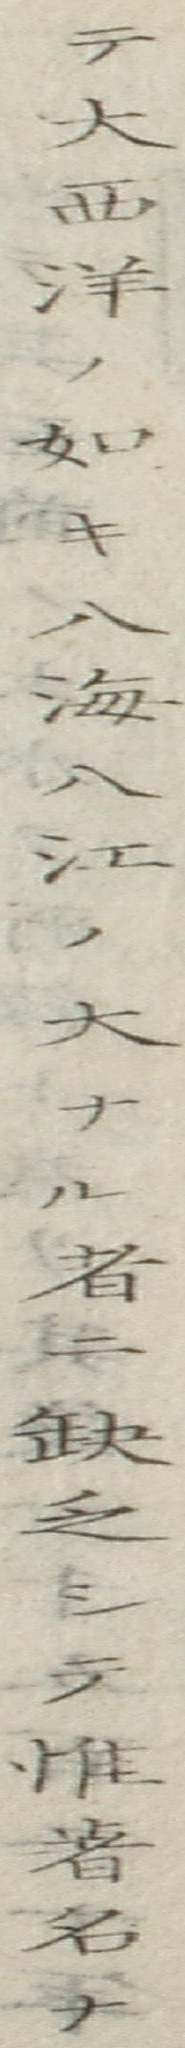テ大西洋ノ如キ入海入江ノ大ナル者ニ欠乏シテ惟著名ナ
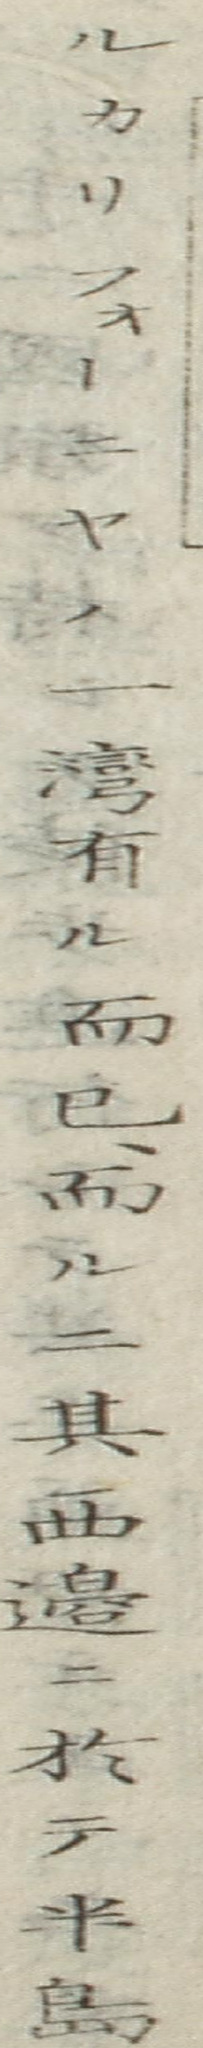ルカリフォーニヤノ一湾有ル而已、而ルニ其西辺に於テ半島
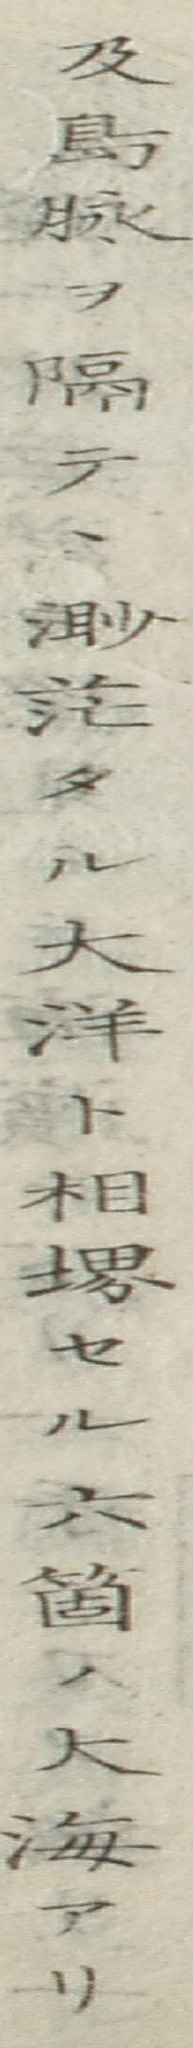及島脉ヲ隔テヽ渺茫タル大洋ト相堺セル六箇ノ大海アリ
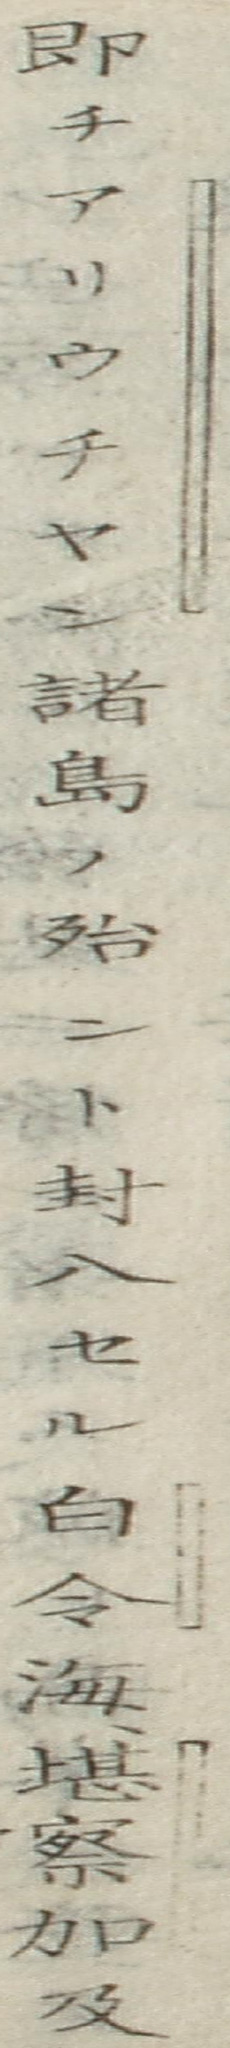即チアリウチヤン諸島ノ殆ント封入セル白令海、堪察加及
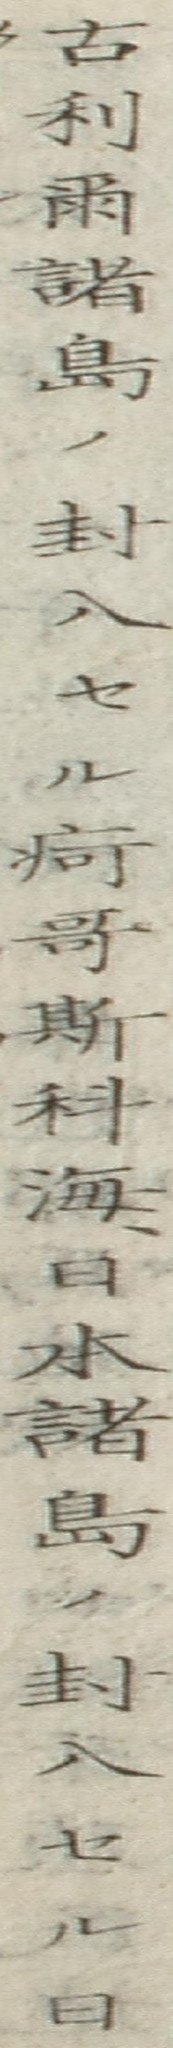古利爾諸島ノ封入セル疴哥斯科海、日本諸島ノ封入セル日
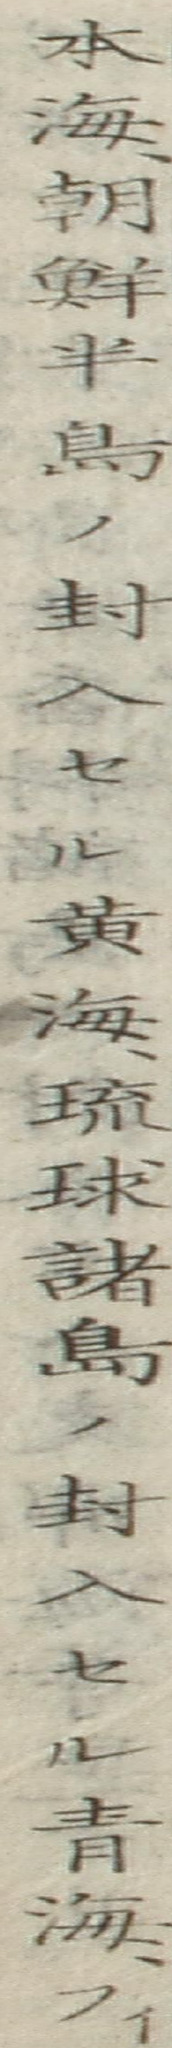本海、朝鮮半島ノ封入セル黄海、琉球諸島ノ封入セル青海、フィ

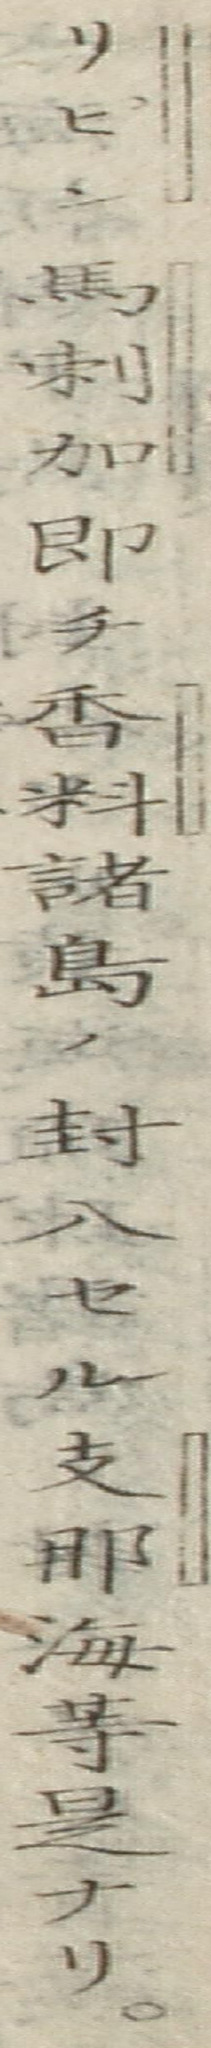リピン馬刺加即チ香料諸島ノ封入セル支那海等是ナリ。
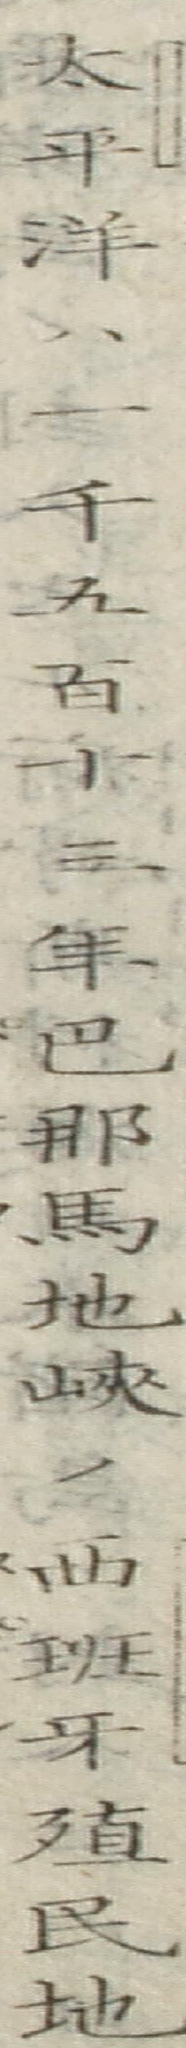太平洋ハ一千五百十三年巴那馬地峡ノ西班牙植民地
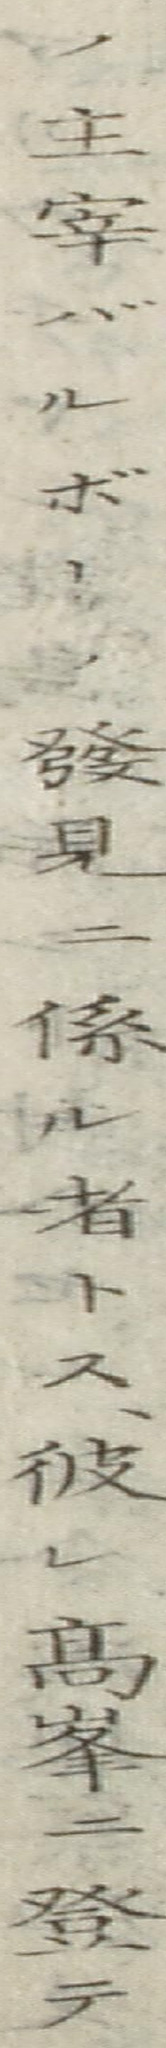ノ主宰バルボーノ発見ニ係ル者トス、彼レ高峰ニ登テ
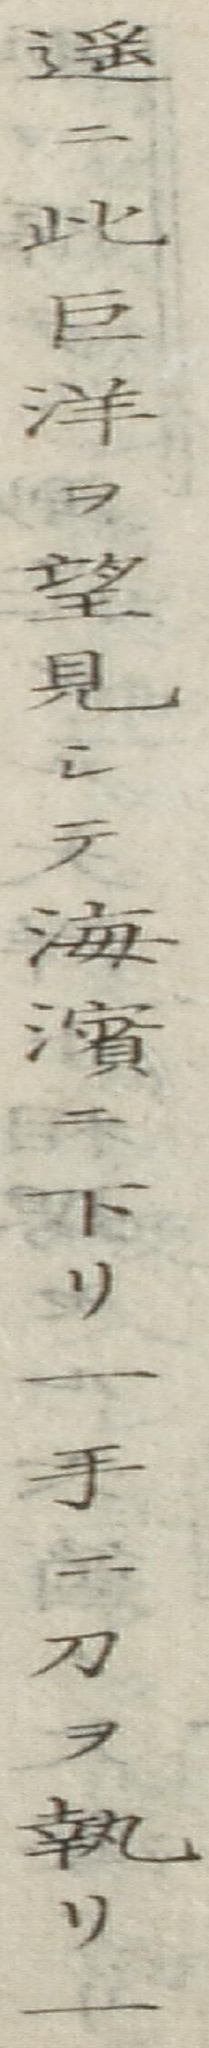遥ニ此巨洋ヲ望見シテ海浜ニ下リ一手ニ刀ヲ執リ一
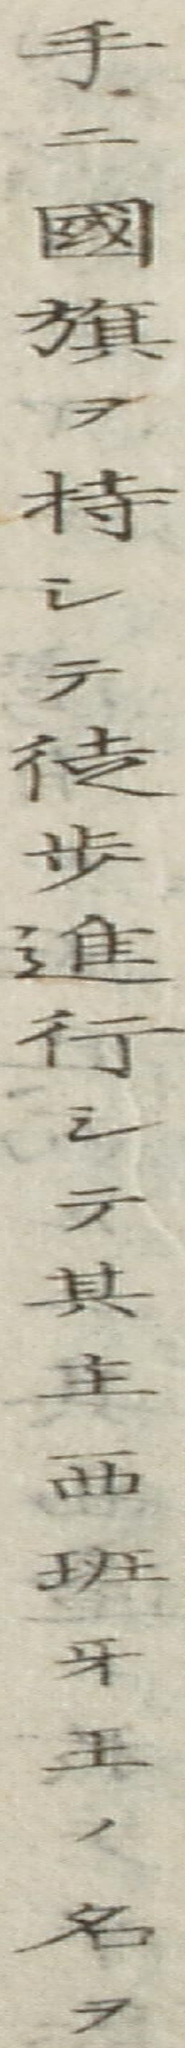手ニ国旗ヲ持シテ徒歩進行シテ其主西班牙王ノ名ヲ
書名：地形論　巻二
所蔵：東京大学地震研究所図書室 Earthquake Research Institute Library, The University of Tokyo, JAPAN
